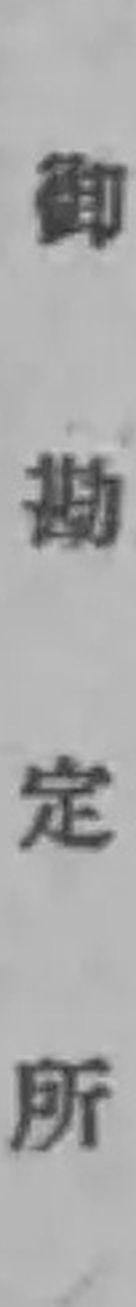御勘定所
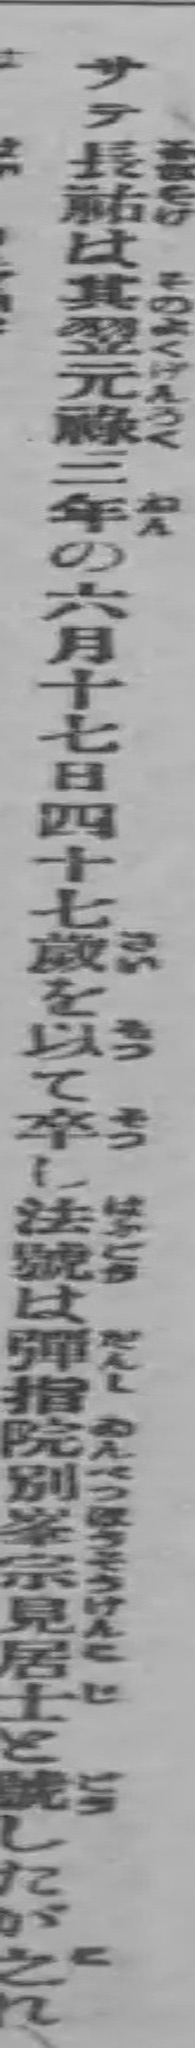長祐卒すサテ長祐は其翌元禄三年の六月十七日四十七歳を以て卒し法号は弾指院別峯宗見居士と号したが之れ
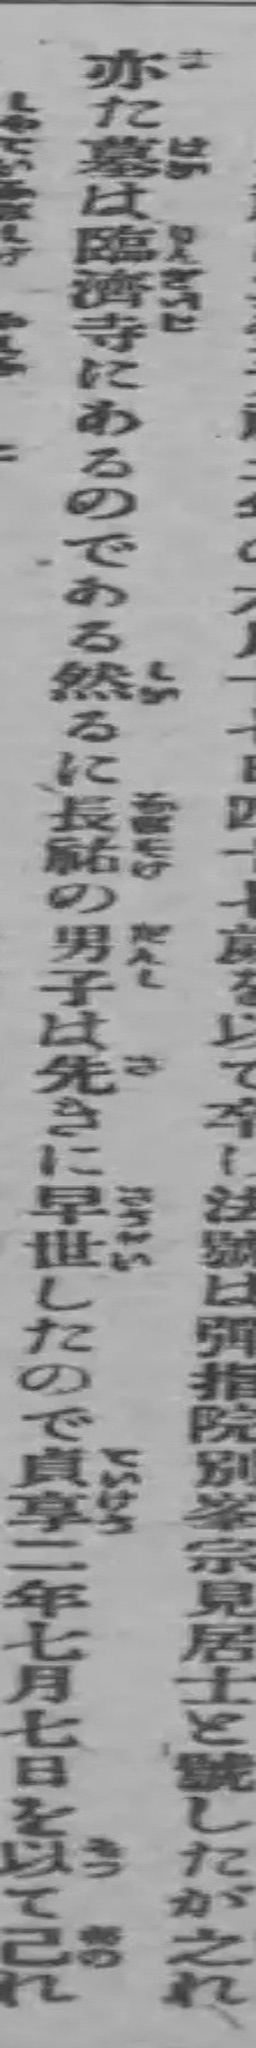小笠原長重亦た墓は臨済寺にあるのである然るに長祐の男子は先きに早世したので貞享二年七月七日を以て己れ
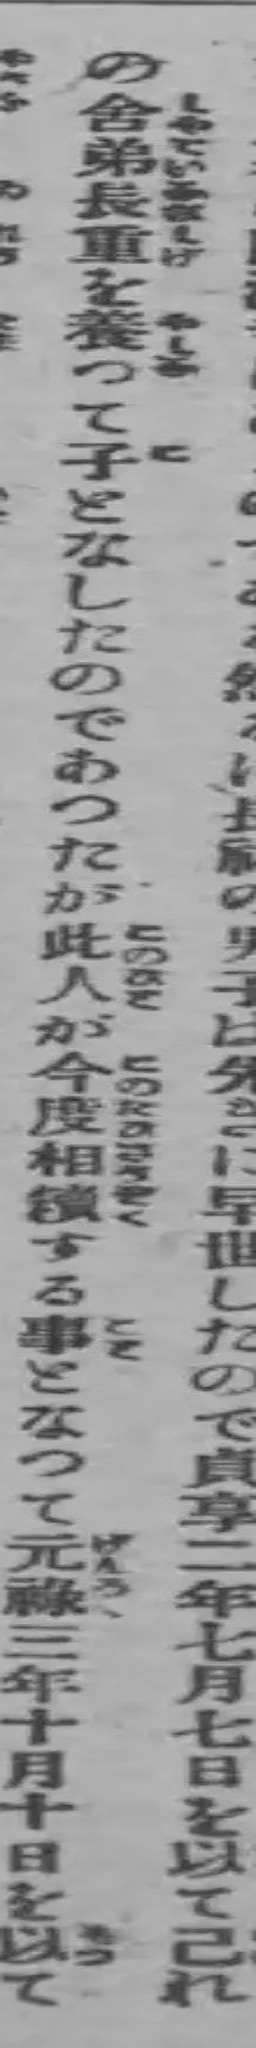の舎弟長重を養つて子となしたのであつたが此人が今度相続する事となつて元禄三年十月十日を以て
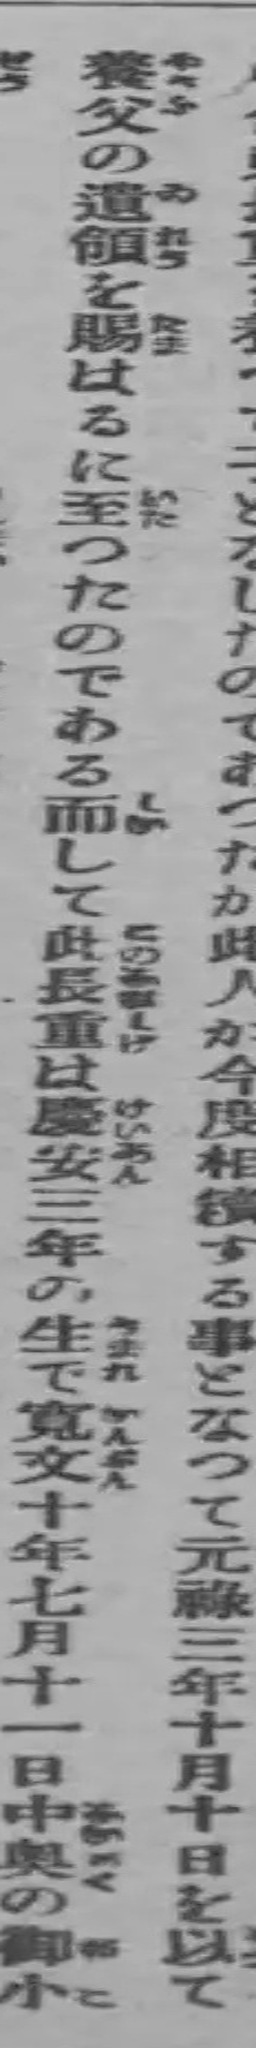養父の遺領を賜はるに至つたのである而して此長重は慶安三年の生で寛文十年七月十一日中奥の御小
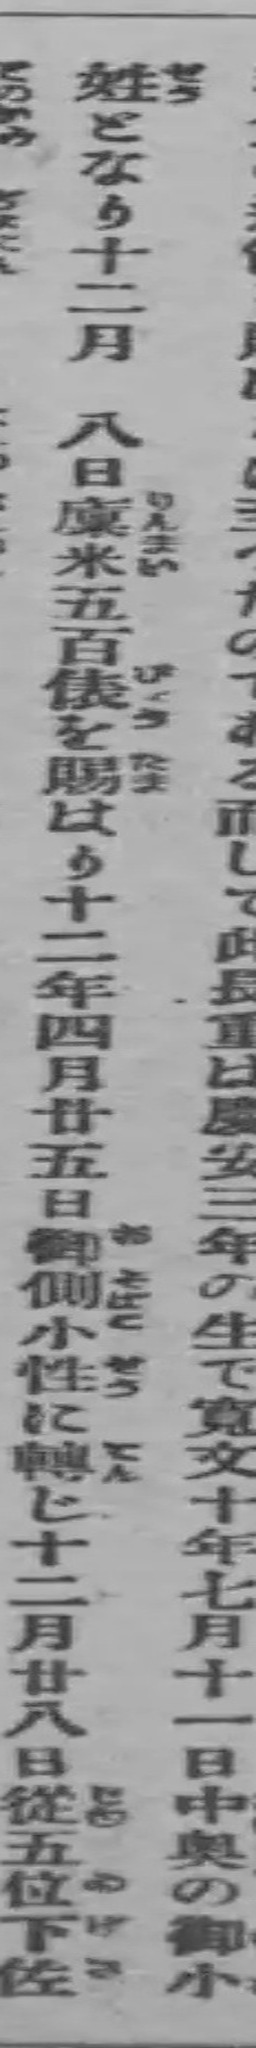姓となり十二月八日廩米五百俵を賜はり十二年四月廿五日御側小姓に転じ十二月廿八日従五位下佐
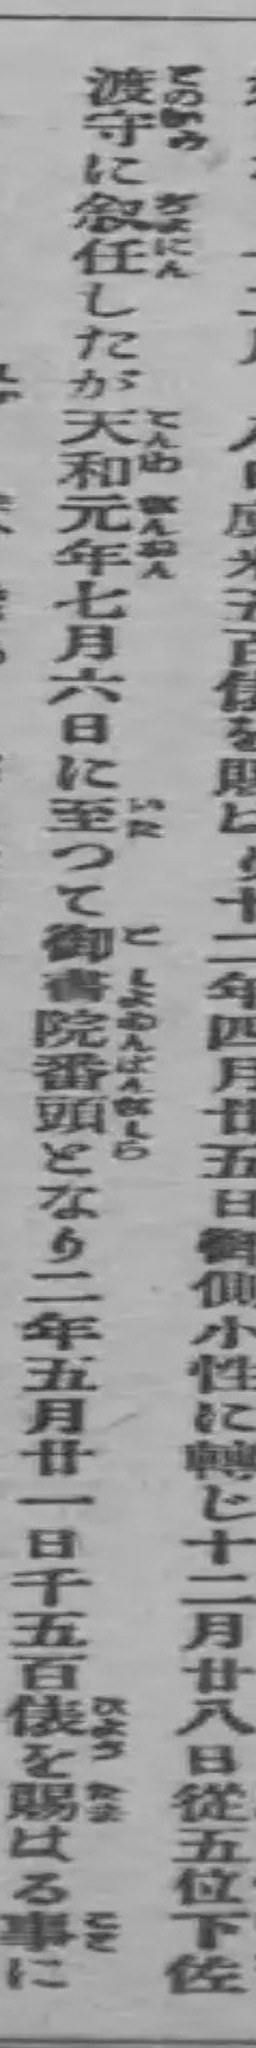渡守に叙任したが天和元年七月六日に至つて御書院番頭となり二年五月廿一日千五百俵を賜はる事に
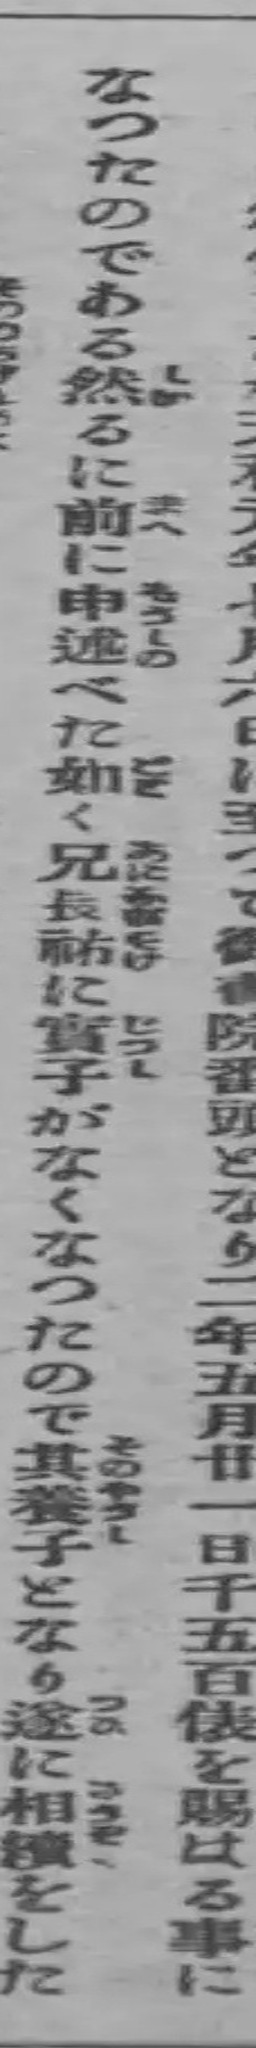なつたのである然るに前に申述べた如く兄長祐に実子がなくなつたので其養子となり遂に相続をした
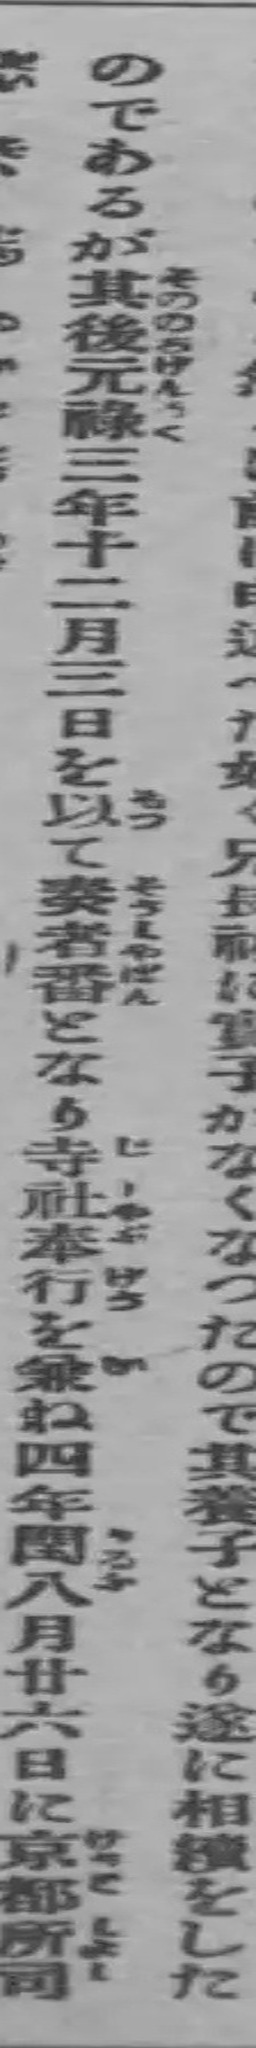のであるが其後元禄三年十二月三日を以て奏者番となり寺社奉行を兼ね四年閏八月廿六日に京都所司
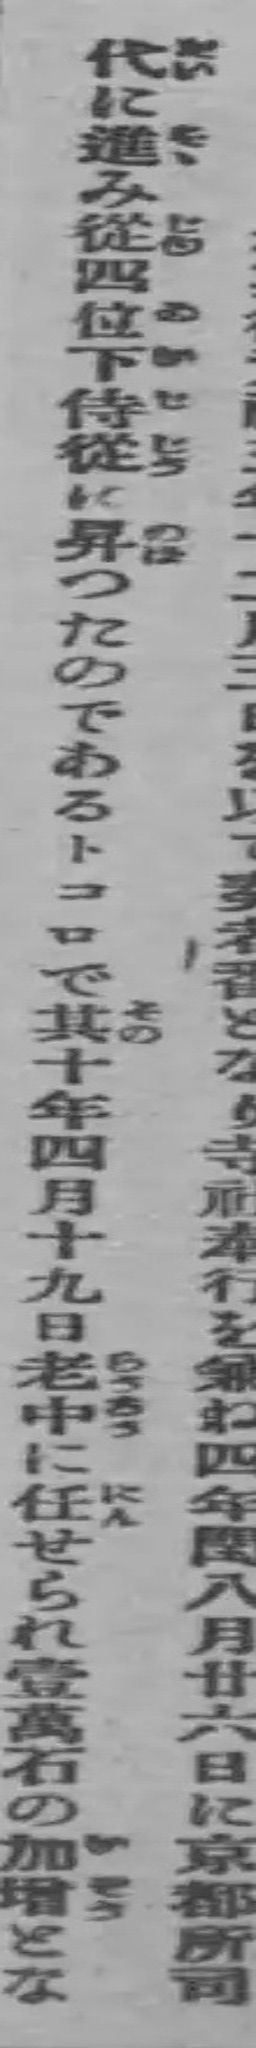代に進み従四位下侍従に昇つたのであるトコロで其十年四月十九日老中に任せられ壱万石の加増とな
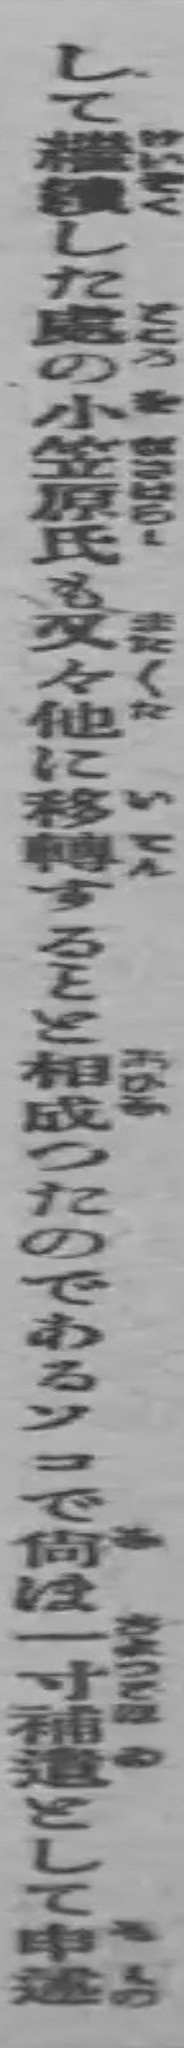補遺して継続した処の小笠原氏も又々他に移転することと相成つたのであるソコで尚ほ一寸補遺として申述
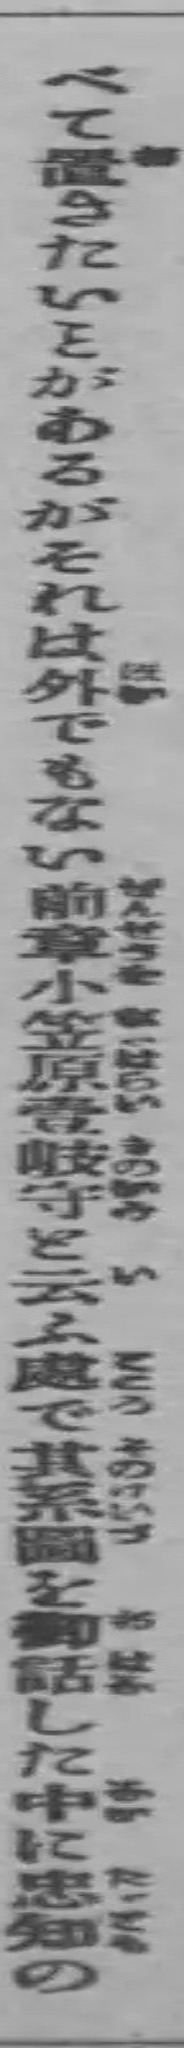べて置きたいことがあるがそれは外でもない前章小笠原壱岐守と云ふ処で其系図を御話した中に忠知の
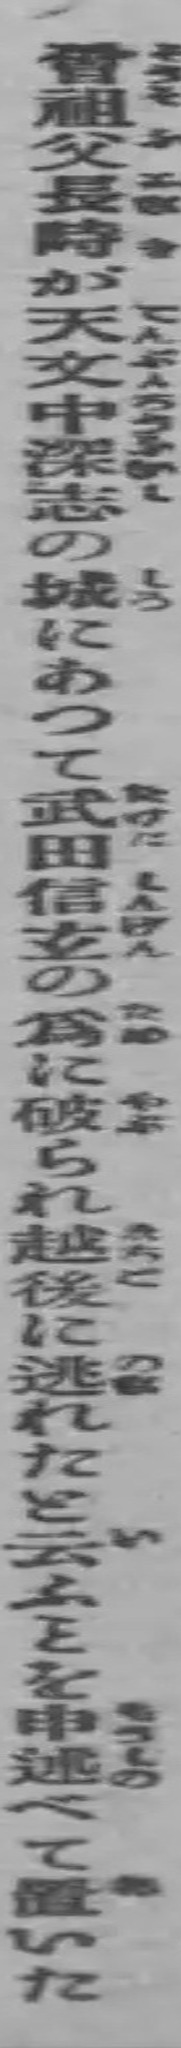曽祖父長時が天文中深志の城にあつて武田信玄の為に破られ越後に逃れたと云ふことを申述べて置いた
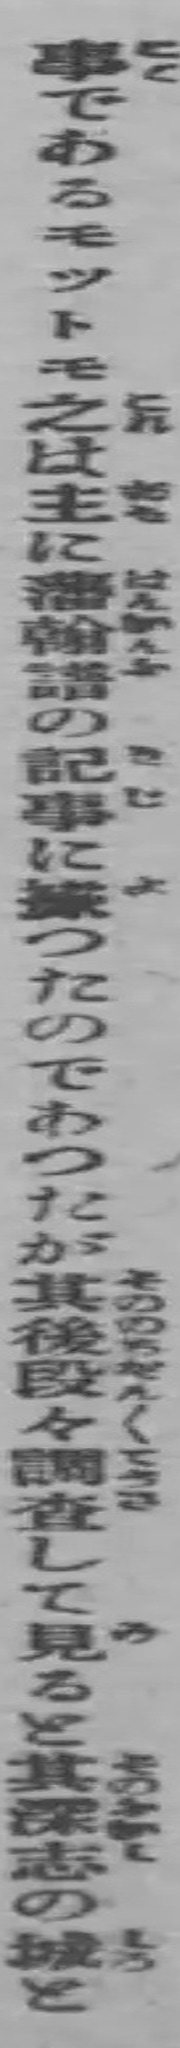事であるモツトモ之は主に藩翰譜の記事に拠つたのであつたが其後段々調査して見ると其深志の城と
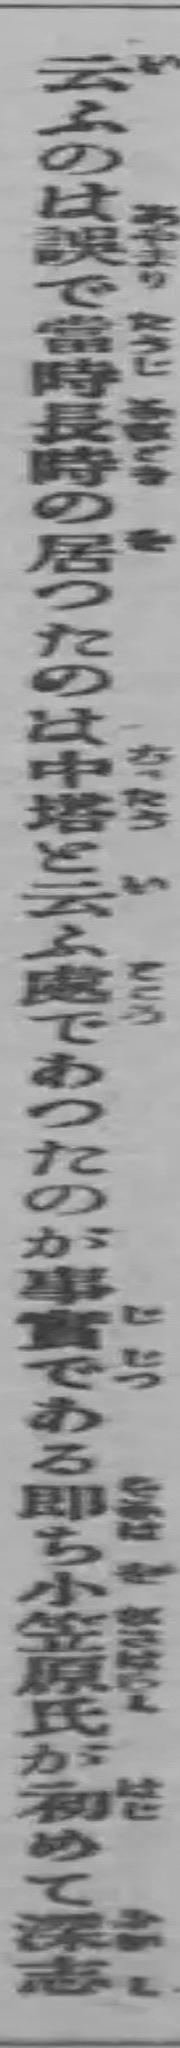云ふのは誤で当時長時の居つたのは中塔と云ふ処であつたのが事実である即ち小笠原氏が初めて深志
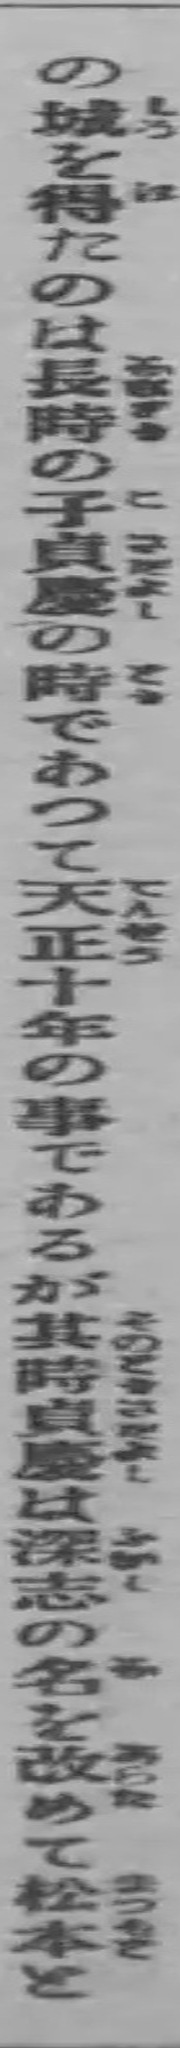の城を得たのは長時の子貞慶の時であつて天正十年の事である其時貞慶は深志の名を改めて松本と
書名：豊橋市史談
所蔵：国立国会図書館 National Diet Library, JAPAN
